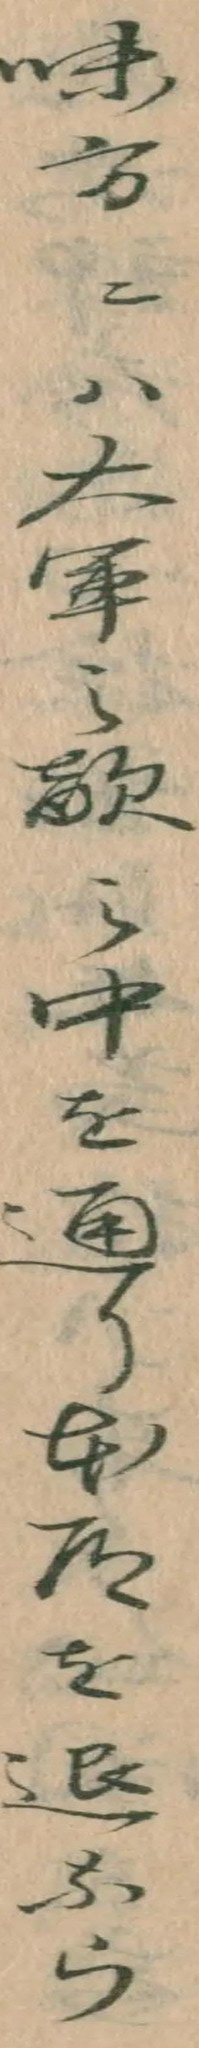味方には大軍之敵之中を通り本道を退なら
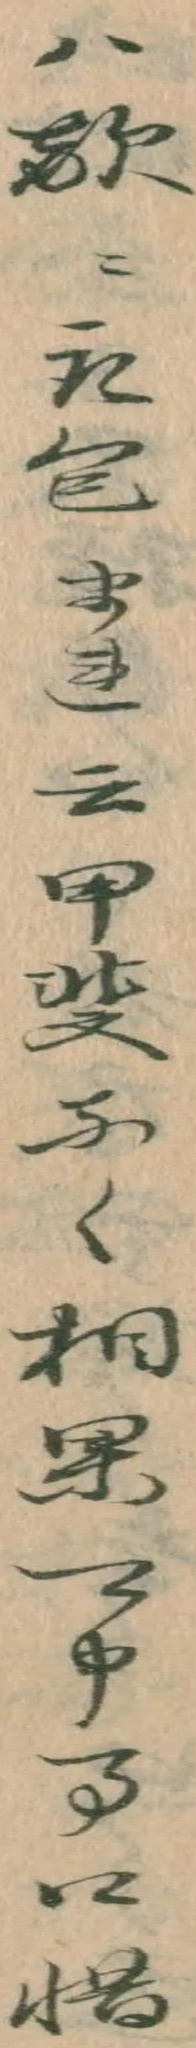は敵に取包ま連云甲斐なく相果可申事口惜
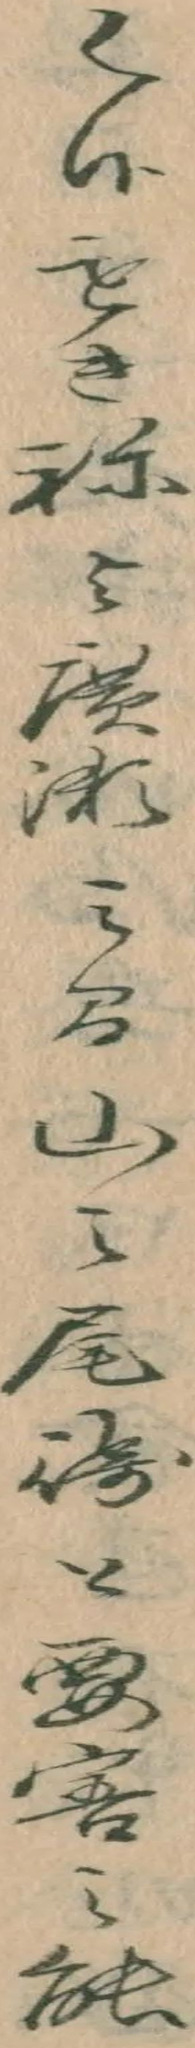く候飛き祢与広瀬之間山之尾崎と要害之能
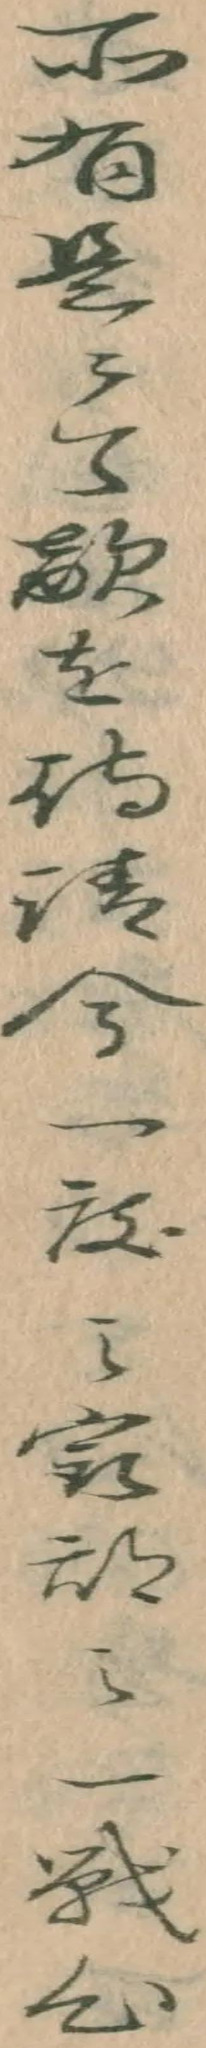所有是にて敵を待請今一度之最期之一戦心
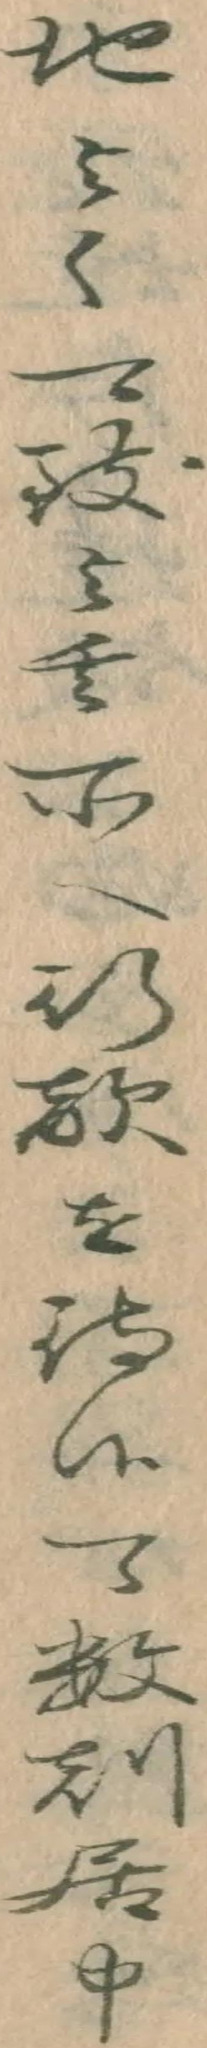地与く可致与其所へ行敵を待候て数刻居申
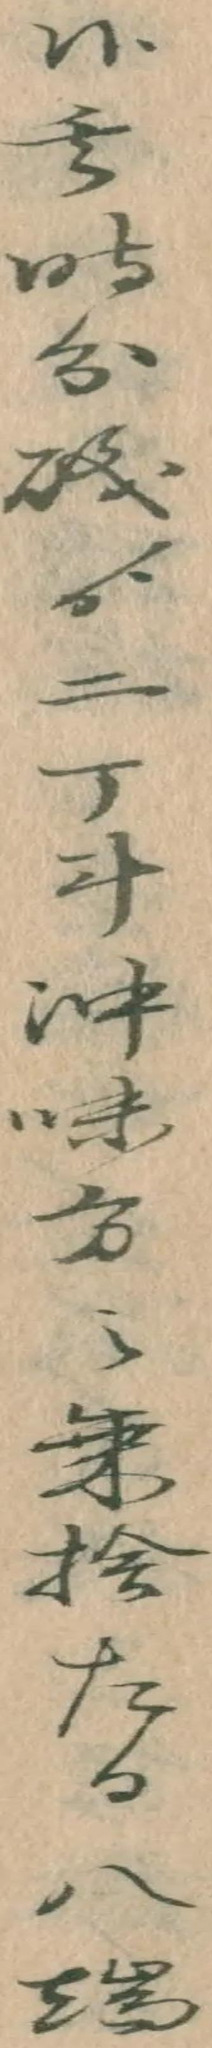候其時分磯ゟ二丁斗沖味方之乗捨たる八端
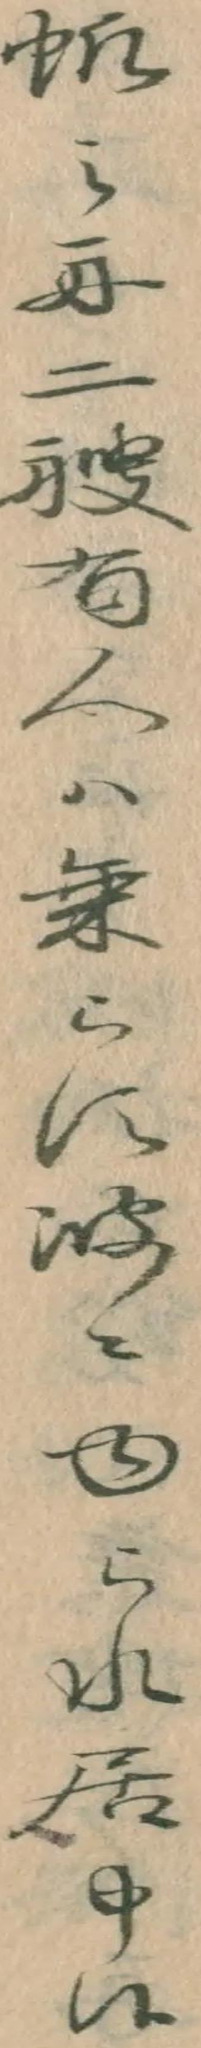帆之舟二艘有人は乗ら須波にゆられ居申候
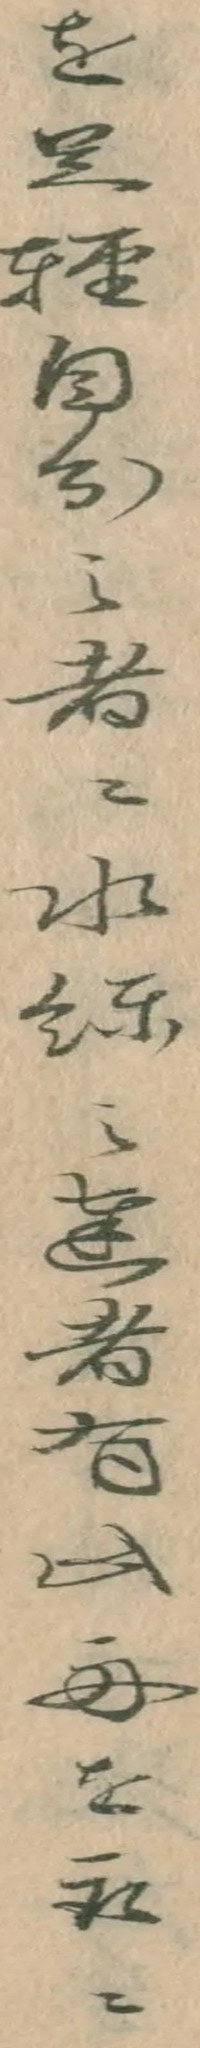を足軽自分之者に水練之達者有此舟を取に
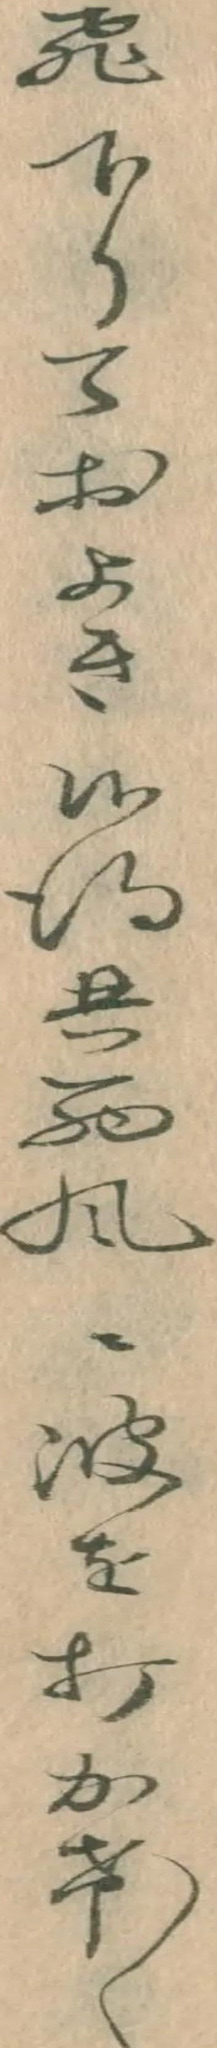飛下りておよき候得共西風に波を打か希〱

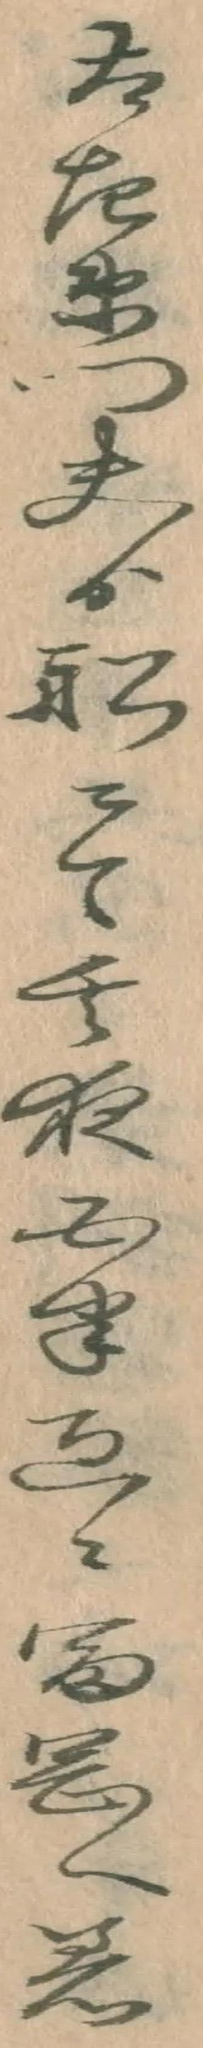太左衛門夫ゟ舩にて其夜五半過に冨岡へ着
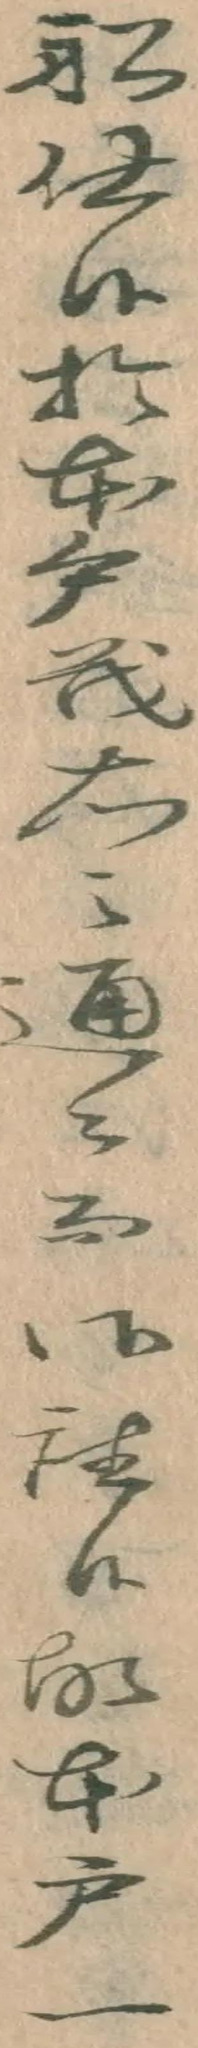舩仕候於本戸茂右之通に而御座候故本戸一
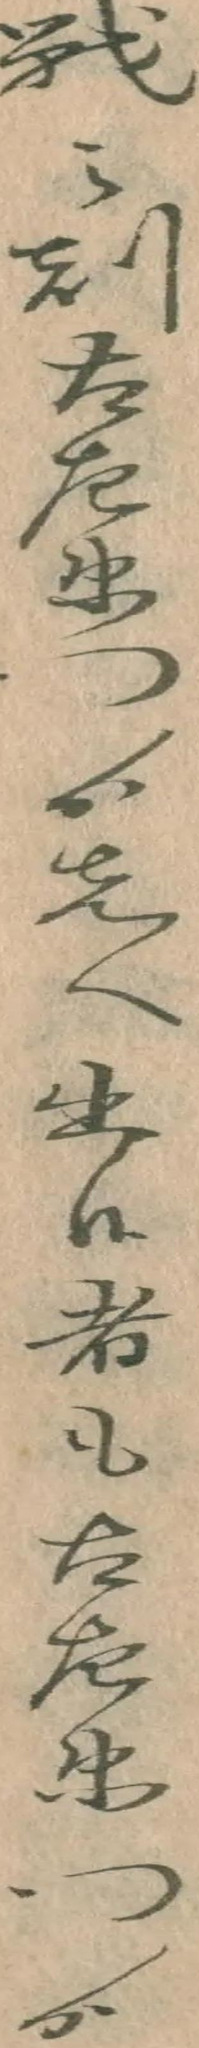戦之刻太左衛門ゟ先へ出候者も太左衛門ゟ
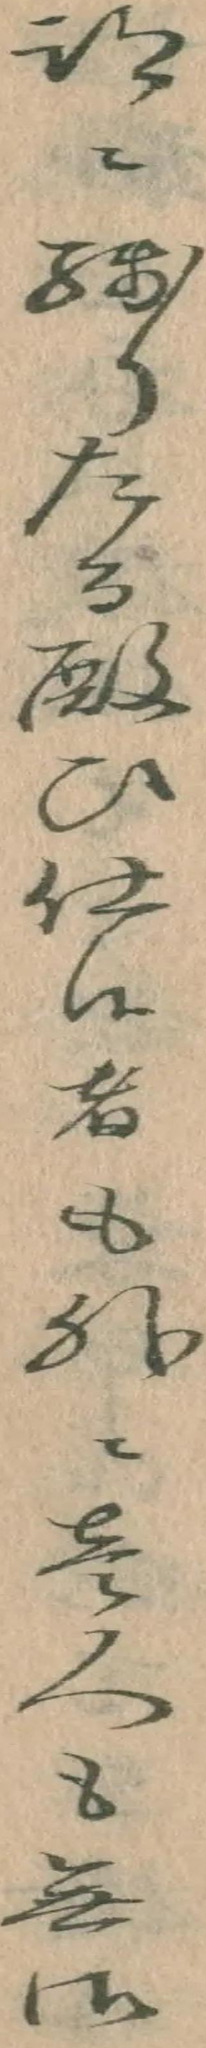跡に残りたる殿ひ仕候者も外に壱人も無御
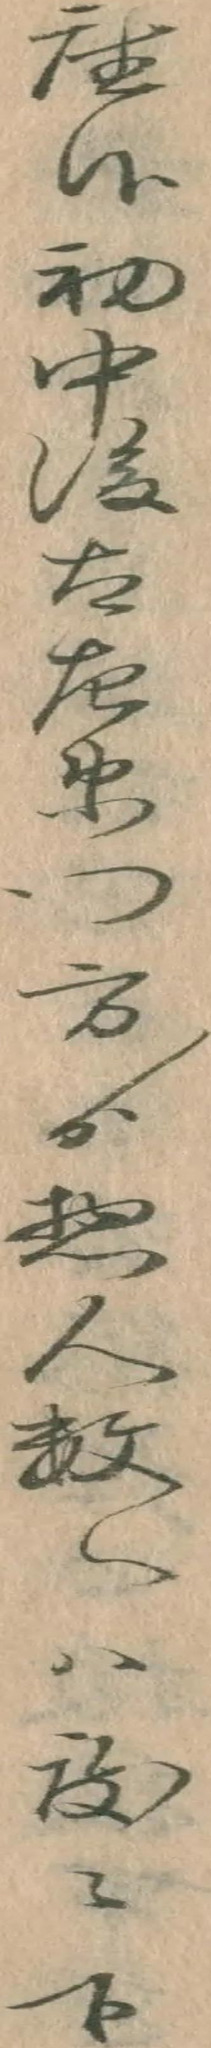座候初中後太左衛門方ゟ惣人数へは度々下
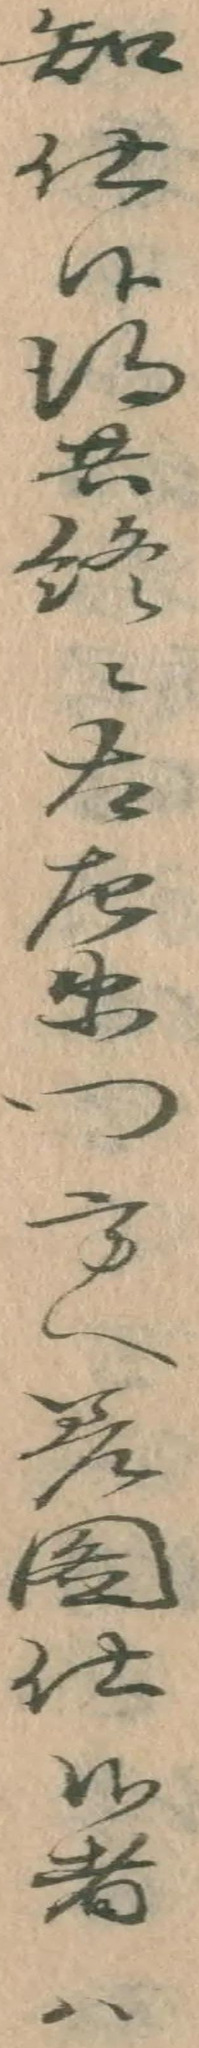知仕候得共終に太左衛門方へ差図仕候者は
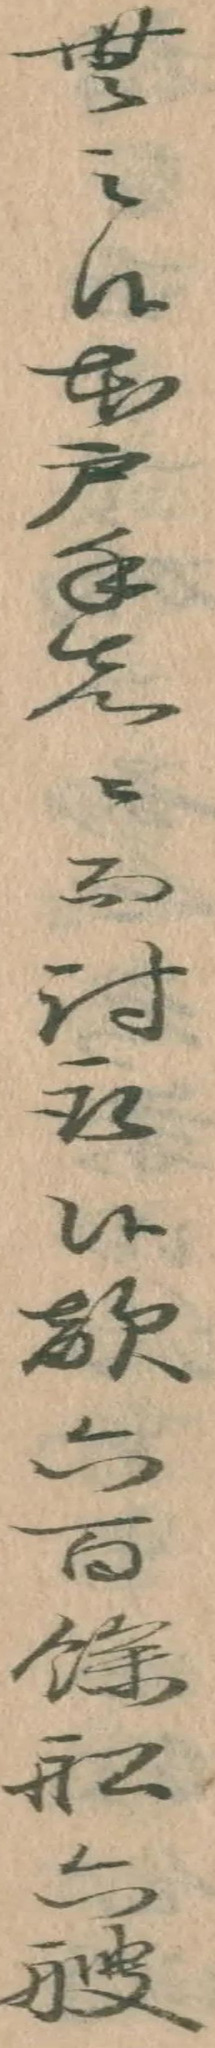無之候本戸手先に而討取候敵六百余舩六艘
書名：切支丹御退治記 49巻. [2]
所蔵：国立国会図書館 National Diet Library, JAPAN
